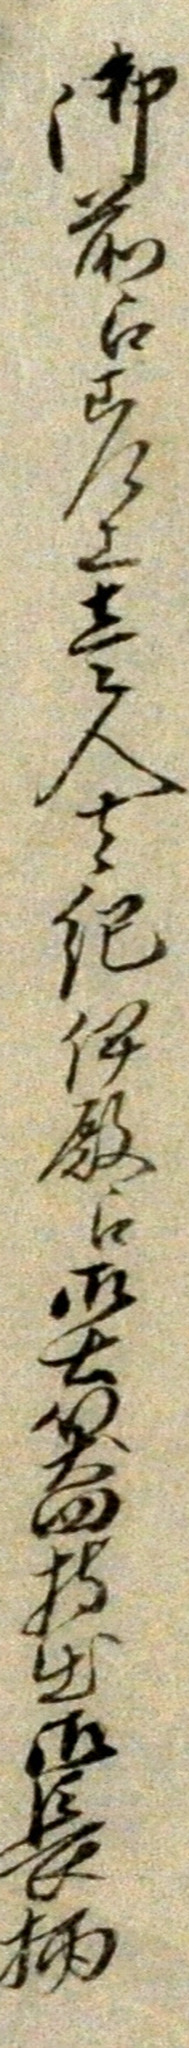御前え差上壱人は紀伊殿え御土器持出御長柄
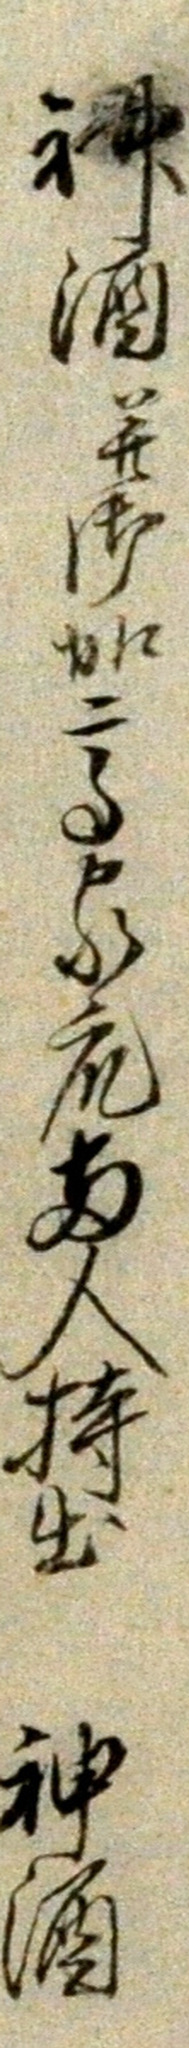神酒并御加高家衆両人持出神酒
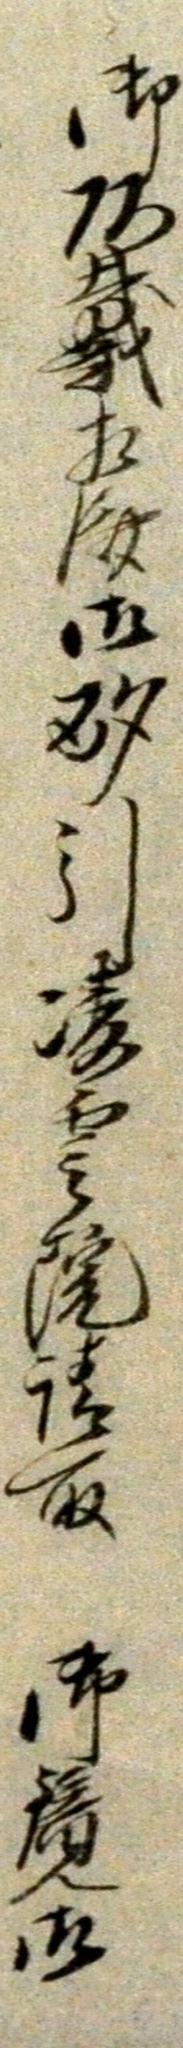御頂戴相済御酌引凌雲院請取御鏡御
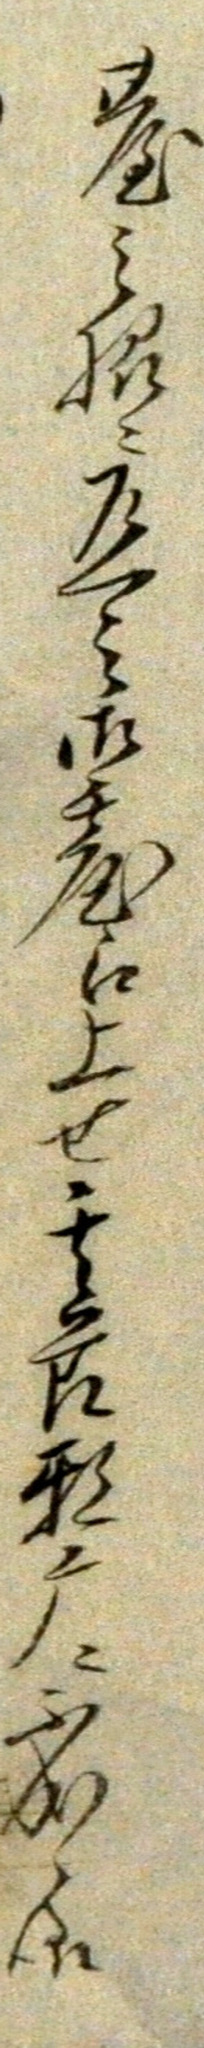台之脇ニ有之御台え上せ其節邪魔ニ不成候様
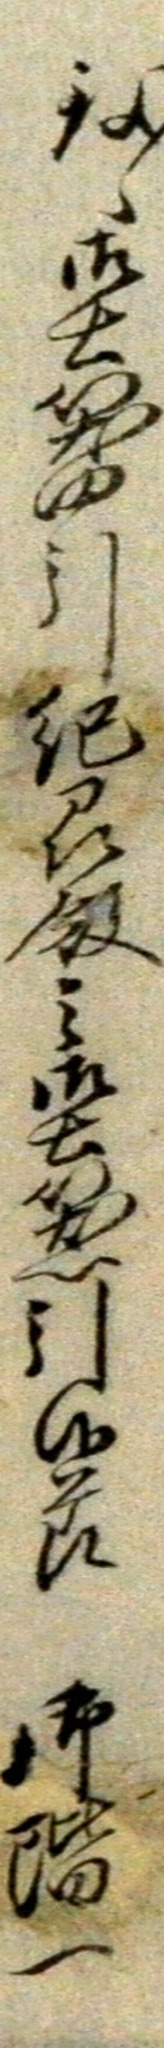致候御土器引紀州殿之御土器引候節御階一
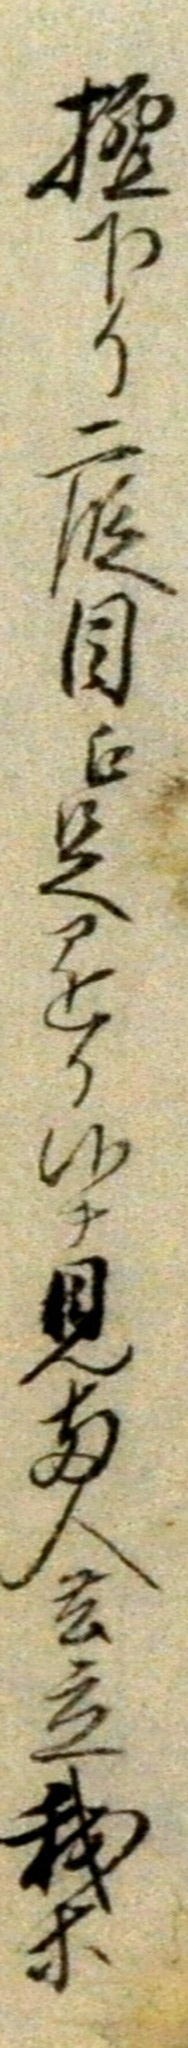壇下り二段目え足懸り候ヲ見両人共立我等

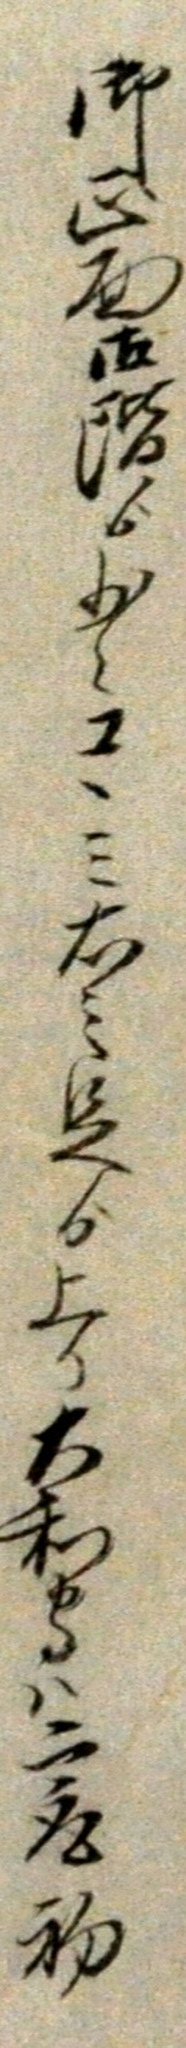御正面御階ゟ少々スヽミ右之足ゟ上り大和守ハ最初
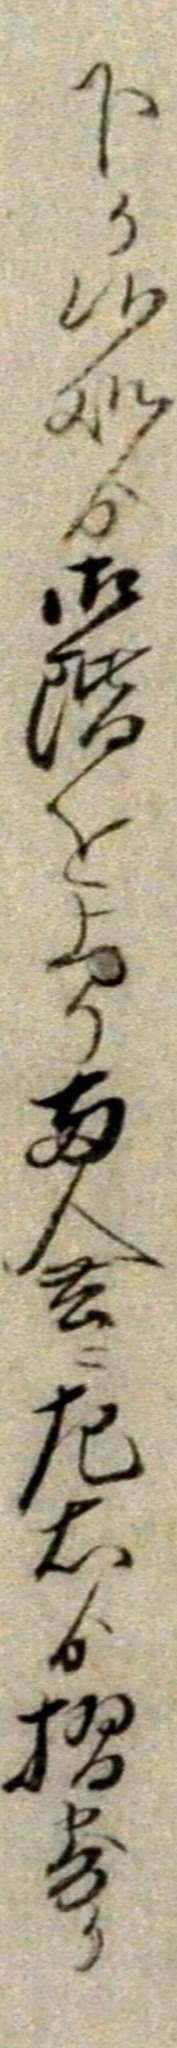下り候処ゟ御階を上り両人共ニ左右ゟ摺寄り
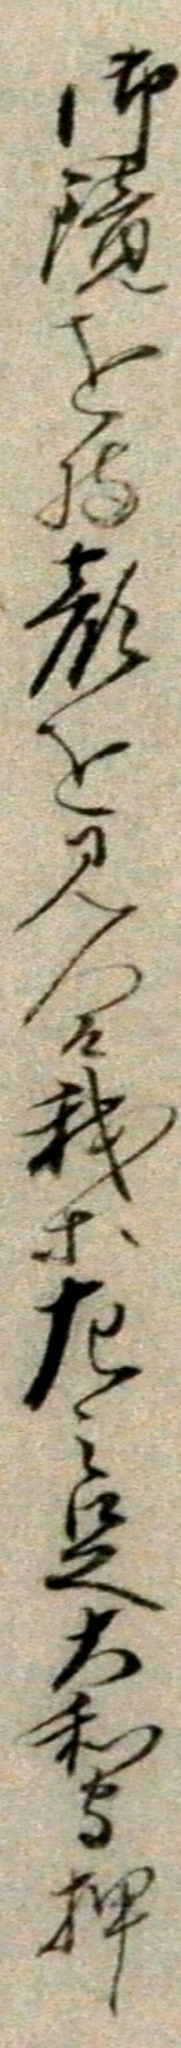御鏡を持顔を見合我等左之足大和守押
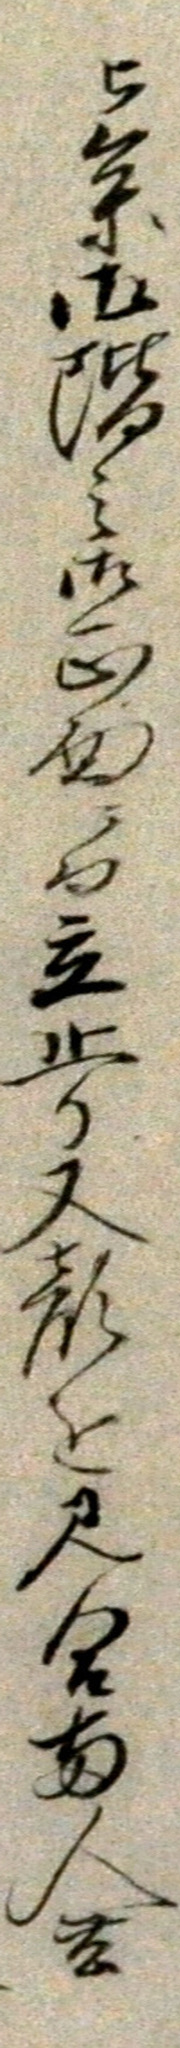被参御階之御正面ニ而立止り又顔を見合両人共
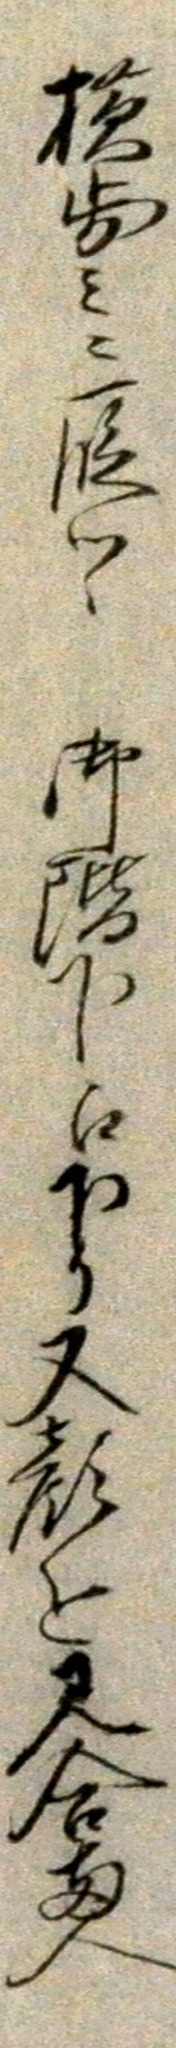横歩ミニ一段ツヽ御階下え下り又顔を見合両人
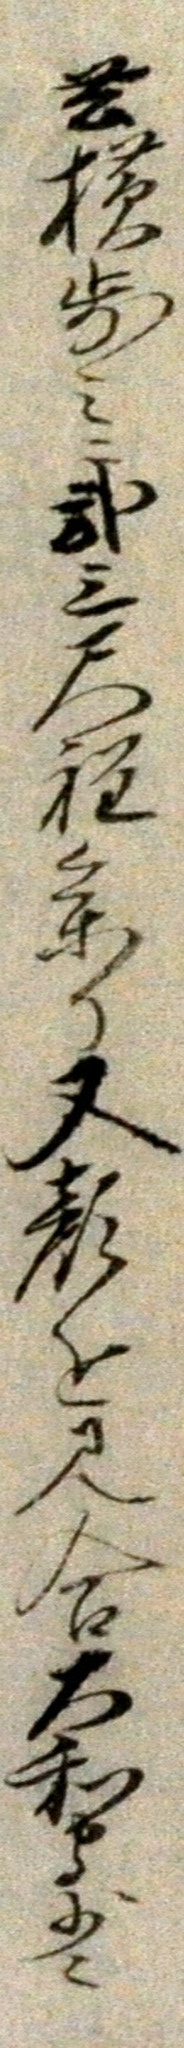共横歩ミニ弍三尺程参り又顔を見合大和守少々
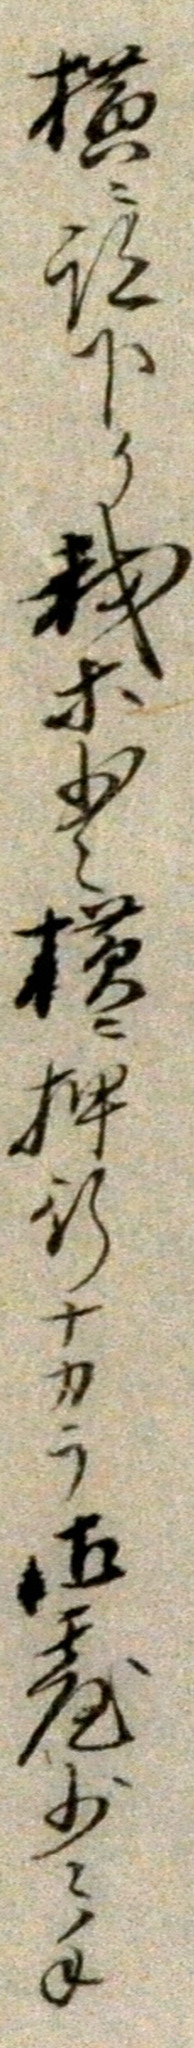横ニ跡下り我等少々横ニ押行ナカラ御台少々手
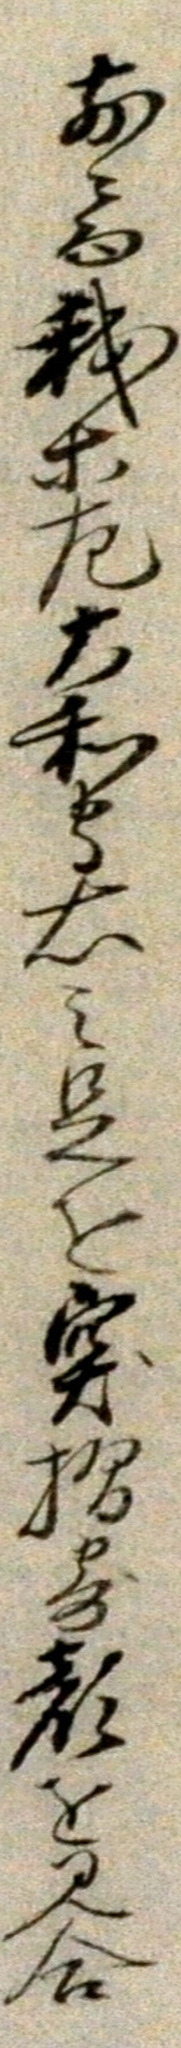前ニ而我等左大和守右之足を突摺寄顔を見合
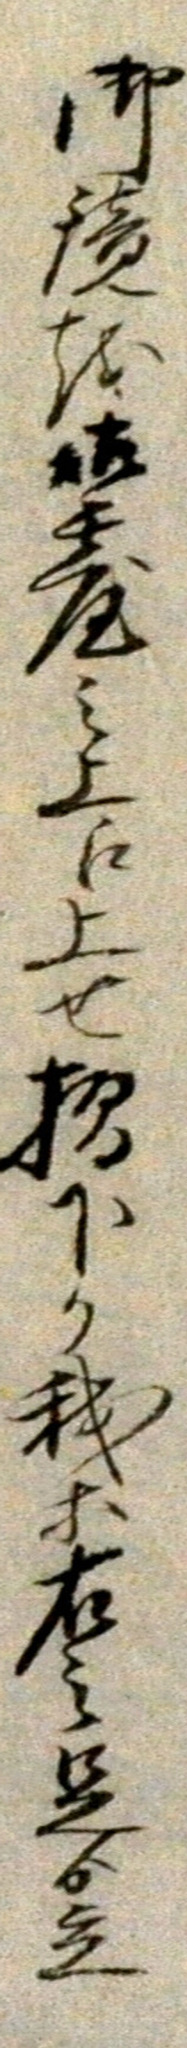御鏡を御台之上え上せ摺下り我等右之足ゟ立
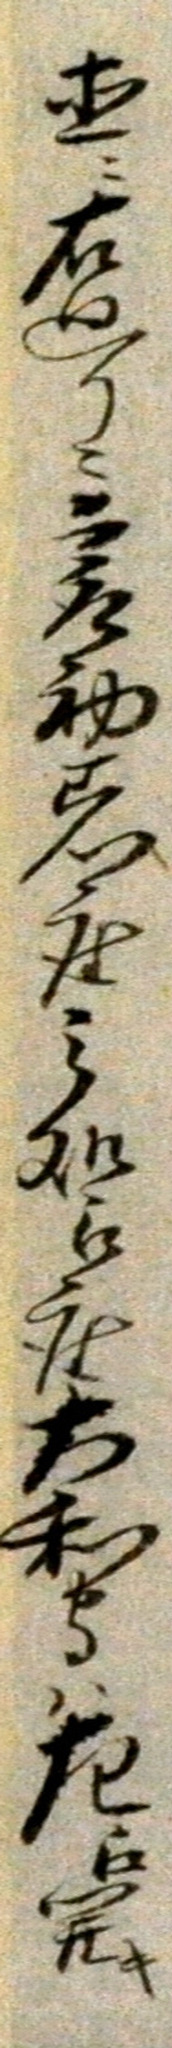直ニ右廻りニ最初着座之処え座大和守ハ左え開キ
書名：御鏡餅御用留（写）
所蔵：伊那市立高遠町図書館・合同会社AMANE
